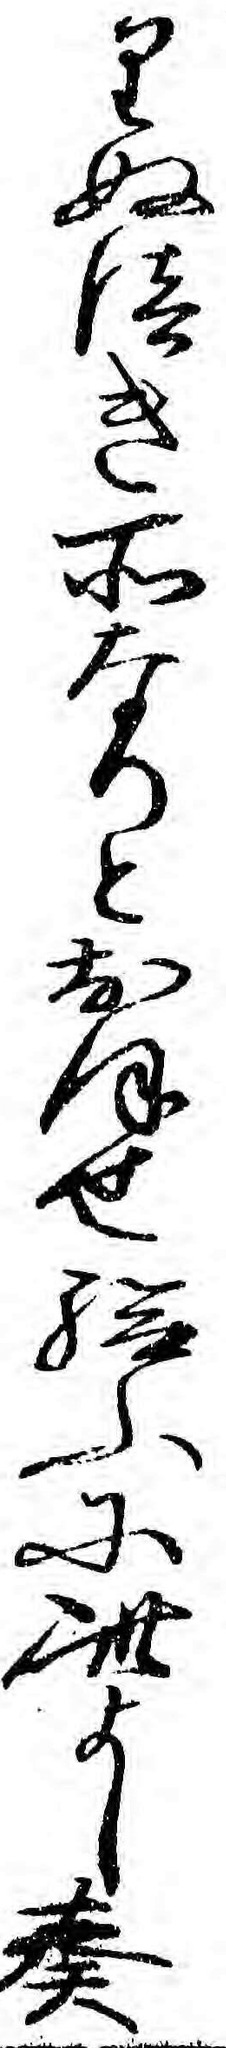りぬべき所なりとおほせ給ふに此よし奏
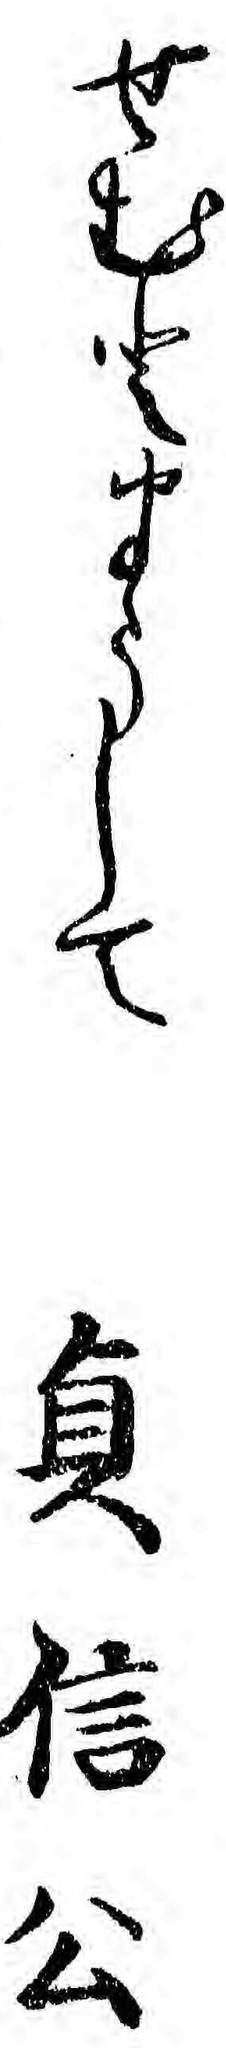せむとまうして貞信公
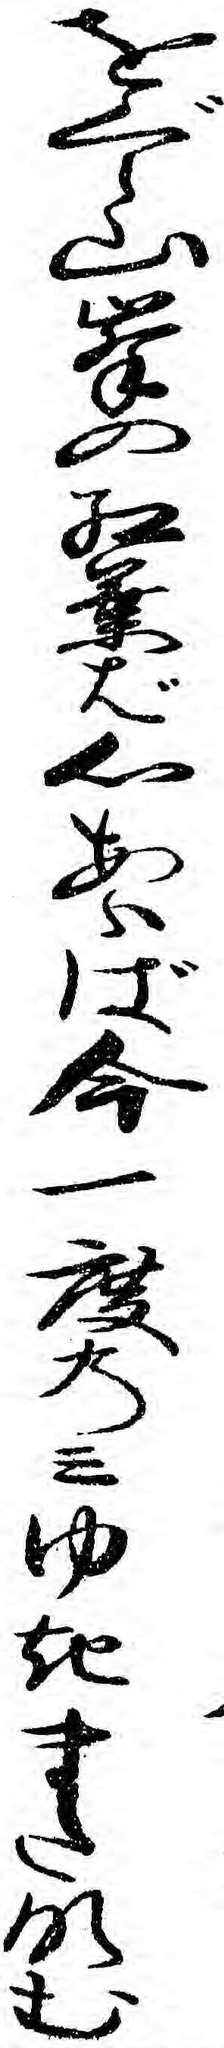をぐら山峯の紅葉ば心あらば今一度のみゆきまたなむ
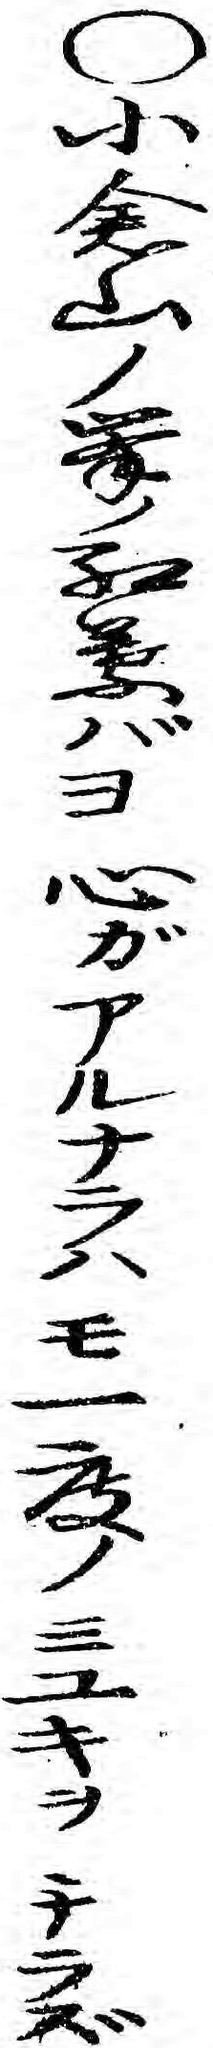○小倉山ノ峯ノ紅葉バヨ心ガアルナラハモ一度ノミユキヲチラズ
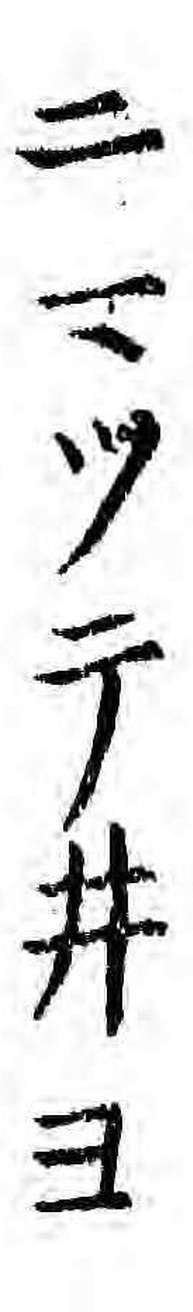ニマツテヰヨ
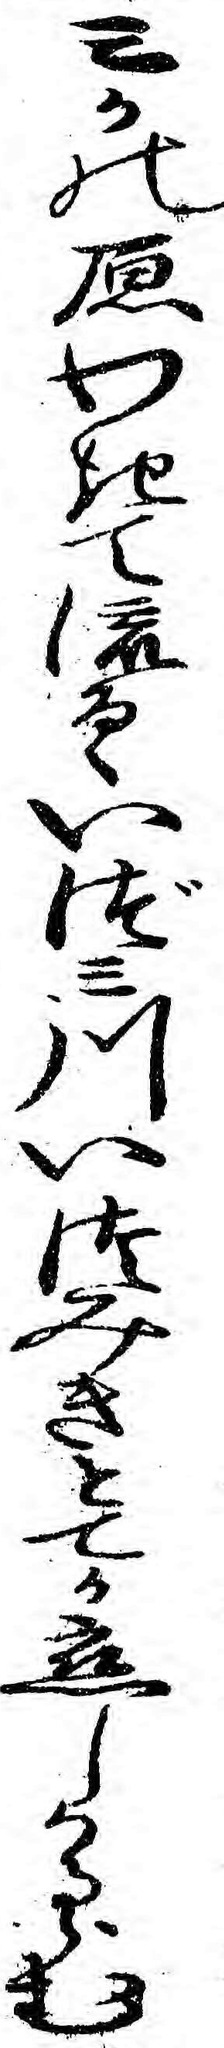みかの原わきて流るゝいづみ川いつみきとてか恋しかるらむ

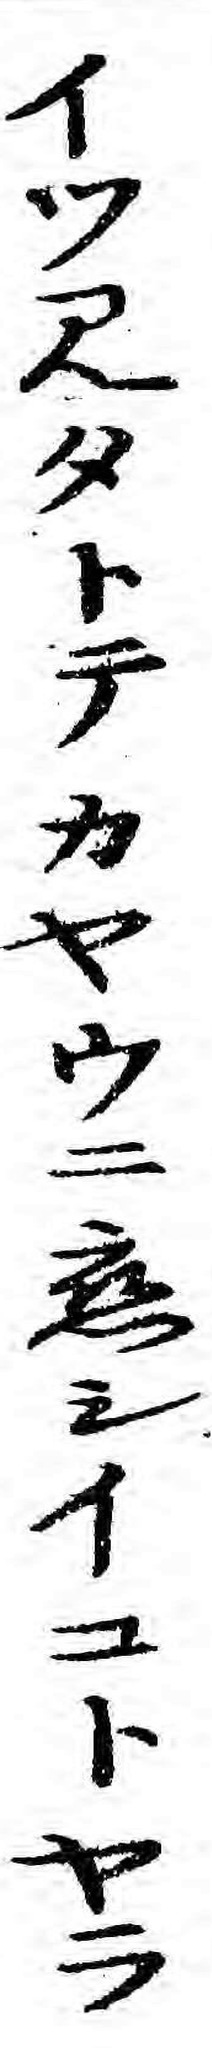○上イツ見タトテカヤウニ恋シイコトヤラ
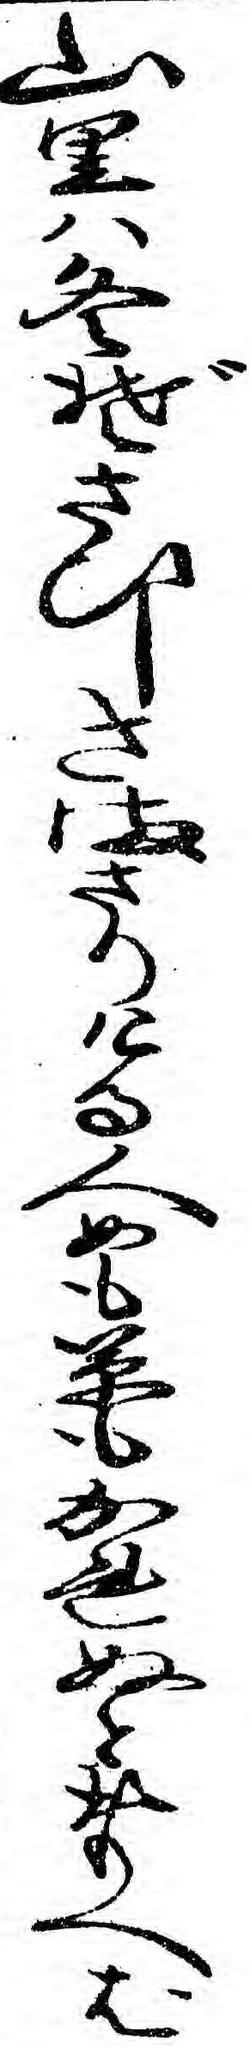山里は冬ぞさびしさまさりける人めも草もかれぬとおもへば
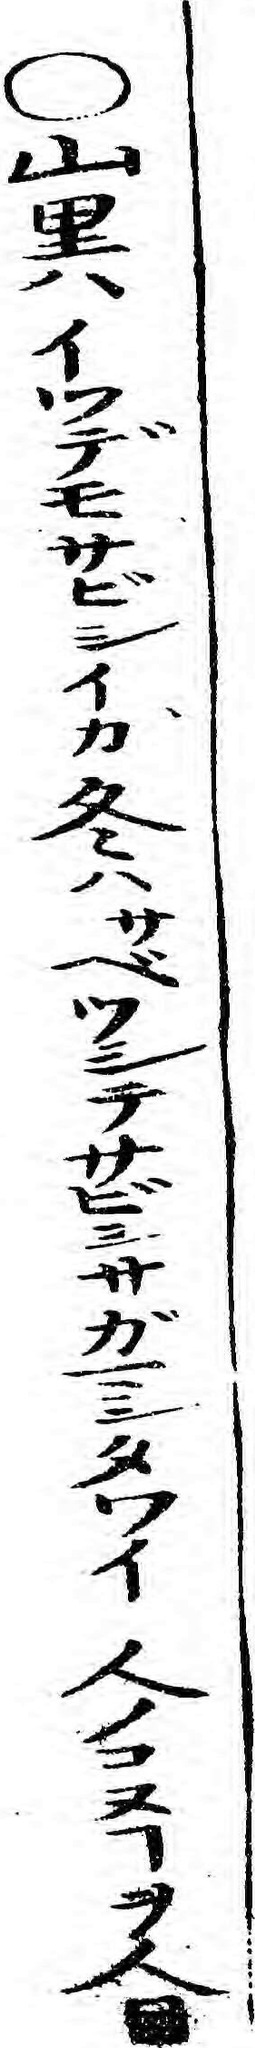○山里ハイツデモサビシイガ冬ハベツシテサビシサガマシタワイ人ノコヌコトヲ人目
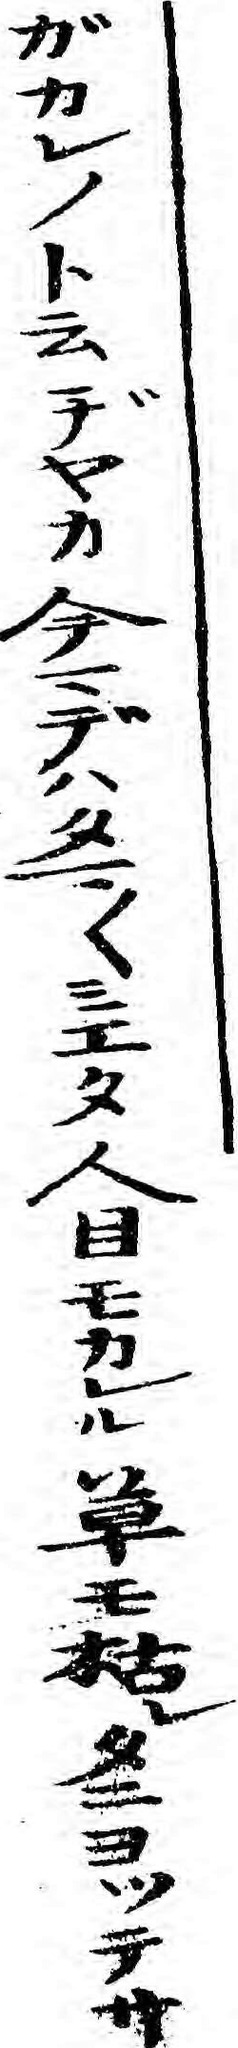ガカレノト云ヂヤカ今マデハタマ〳〵ミエタ人目モカレル草モ枯タニヨツテサ
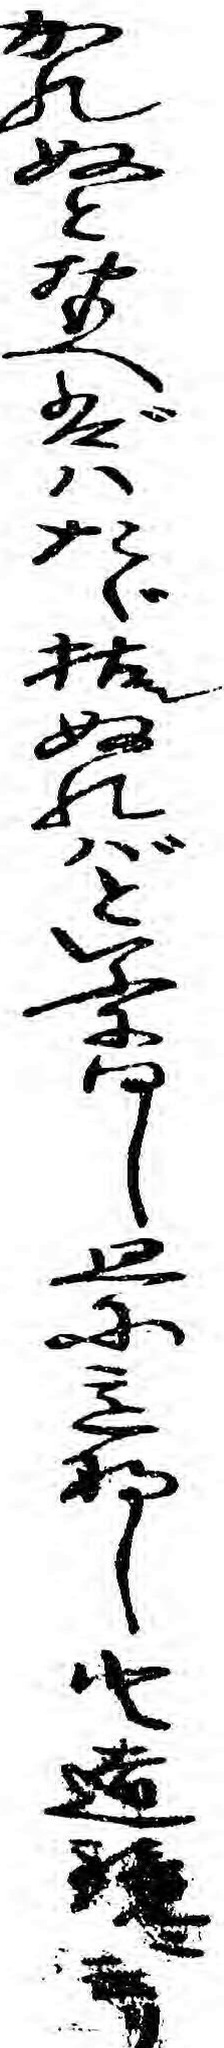かれぬとおもへばはたゞ枯ぬればといふに同し思に意なしと遠鏡ニ云リ
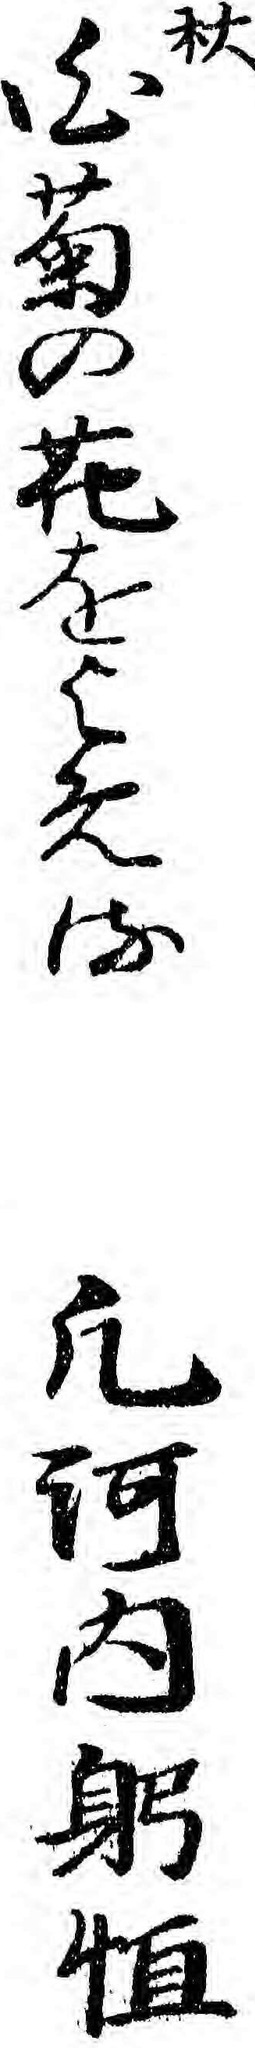古今集秋白菊の花をよめる凡河内躬恒
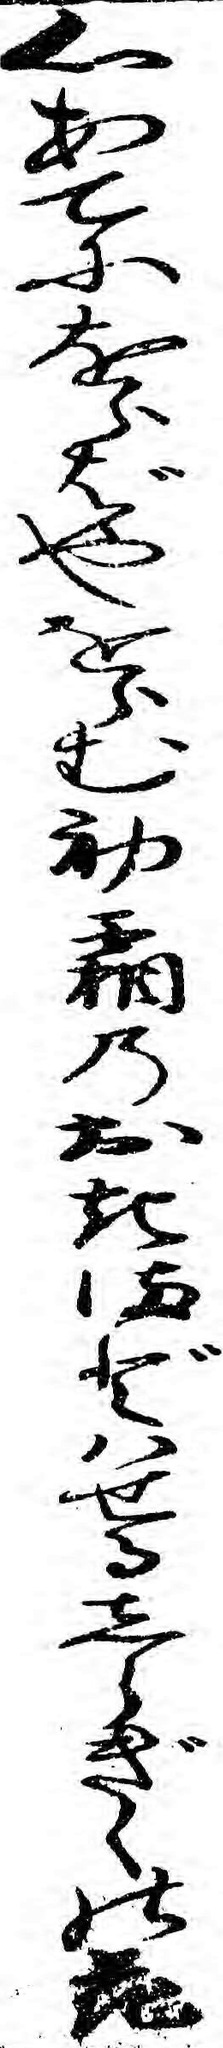心あてにをらばやをらむ初霜のおきまどはせるしらぎくの花
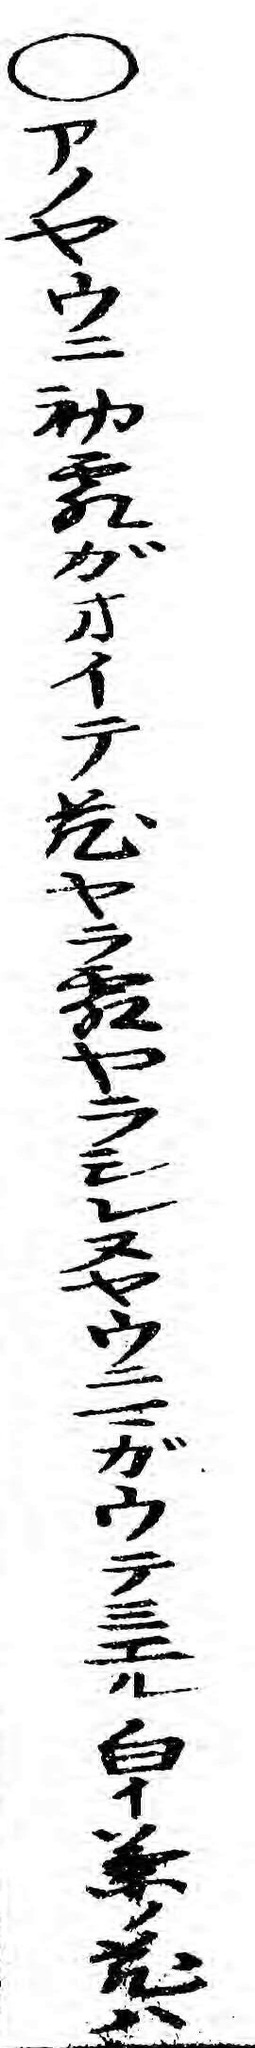○アノヤウニ初霜ガオイテ花ヤラ霜ヤラシレヌヤウニマガウテミエル白イ葉ノ花ハ
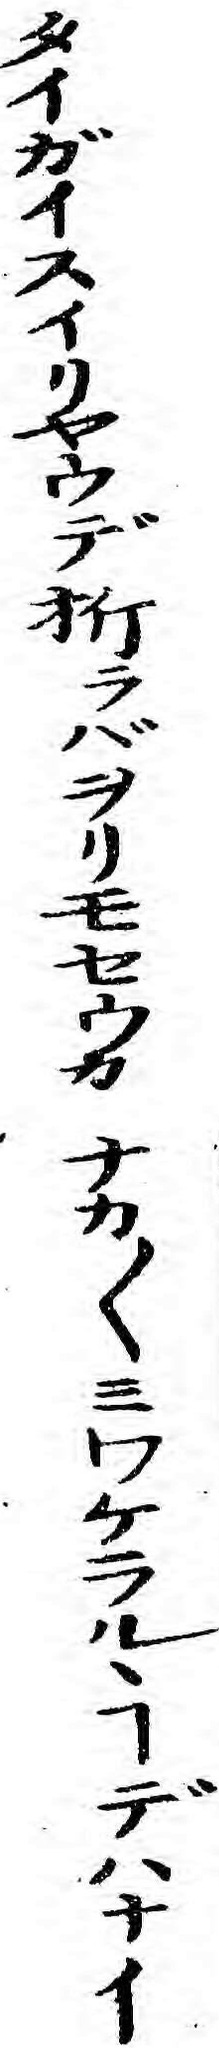タイガイスイリヤウデ折ラバヲリモセウカナカ〳〵ミワケラルヽコトデハナイ
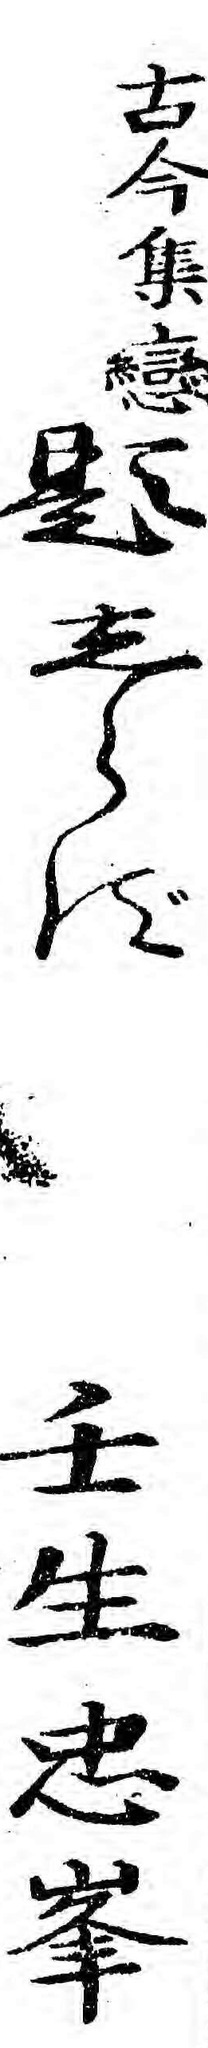古今集恋題しらず壬生忠岑
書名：百人一首／小倉の山ふみ
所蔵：国文学研究資料館
